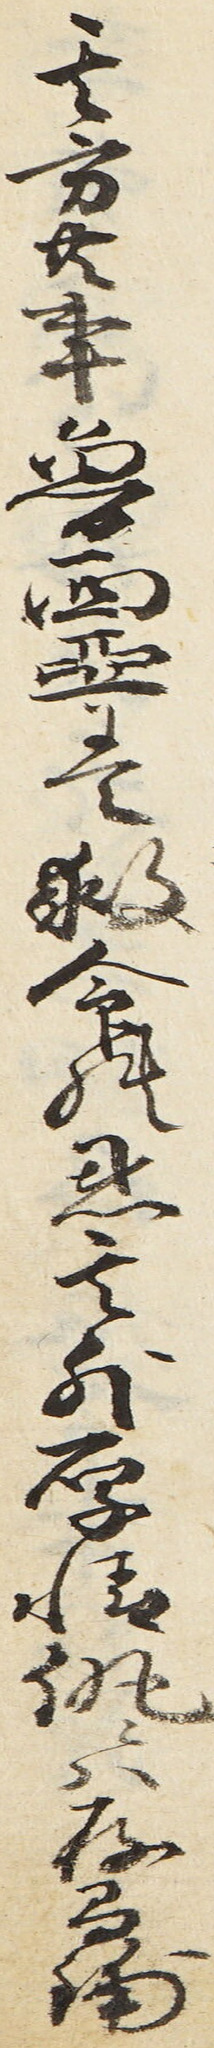其方共事魯西亜にて救命の恩其外厚情仇には存間鋪

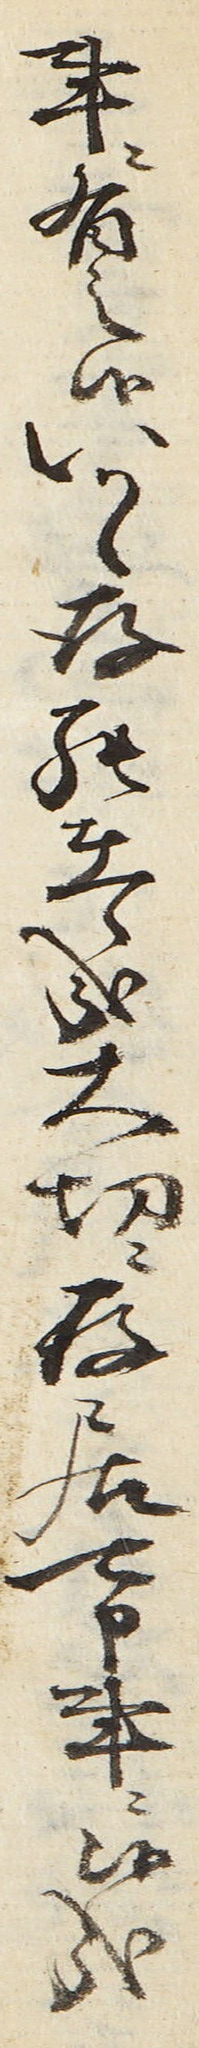事に有之候いかゝ存罷在候哉大切に存居可申事に候哉
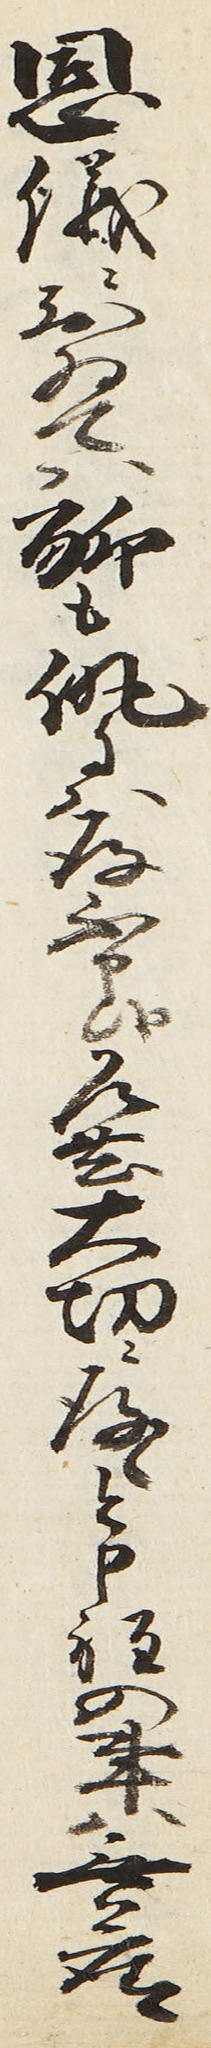恩儀におゐては聊も仇には存不申候乍去大切に存候と申程の事は無御座候
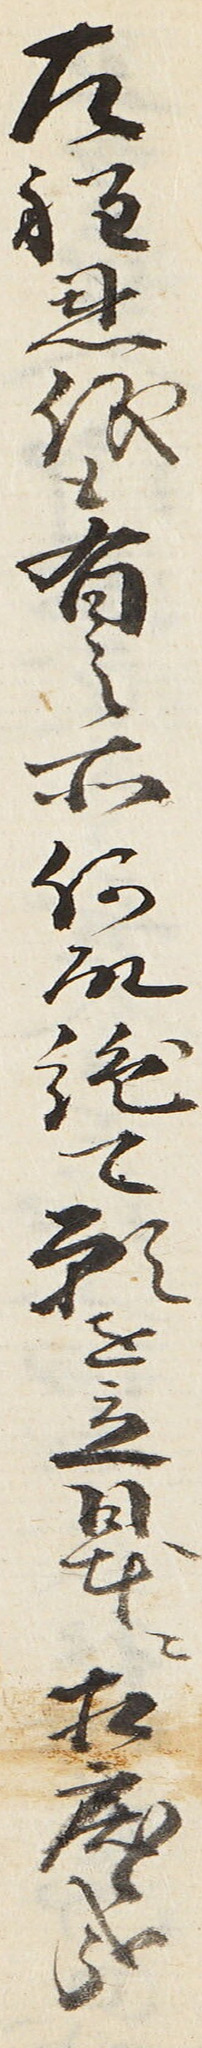左程恩儀も有之候所何故強て願を立日本に相戻候哉
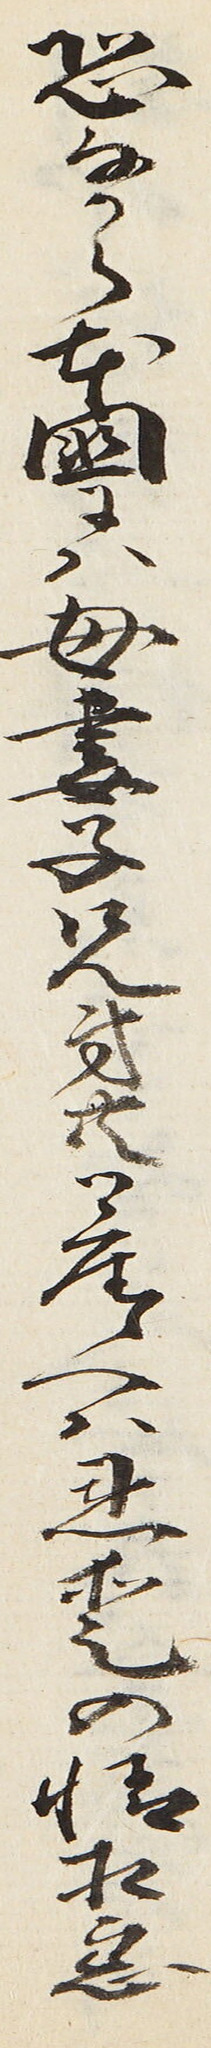恐なから本国には母妻子兄弟共御座候へは恩愛の情相忘
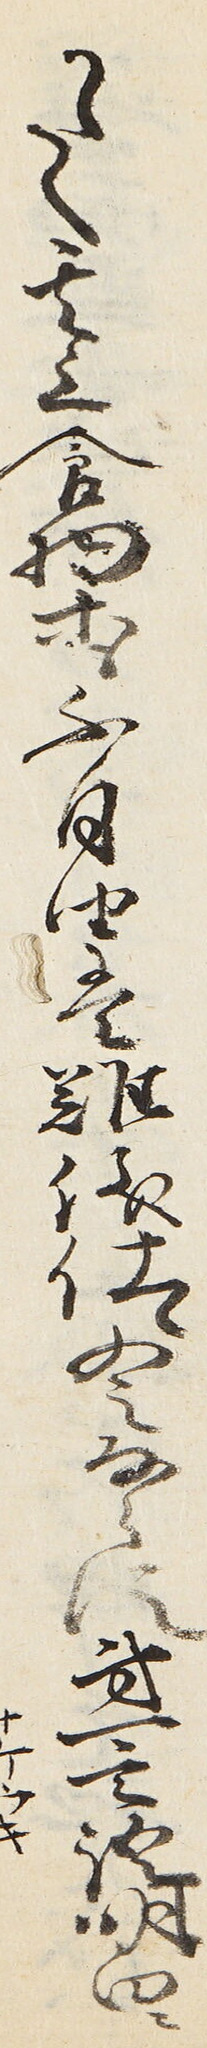かたし其上食物等も不自由にて難儀仕候のみならす第一言語明白に
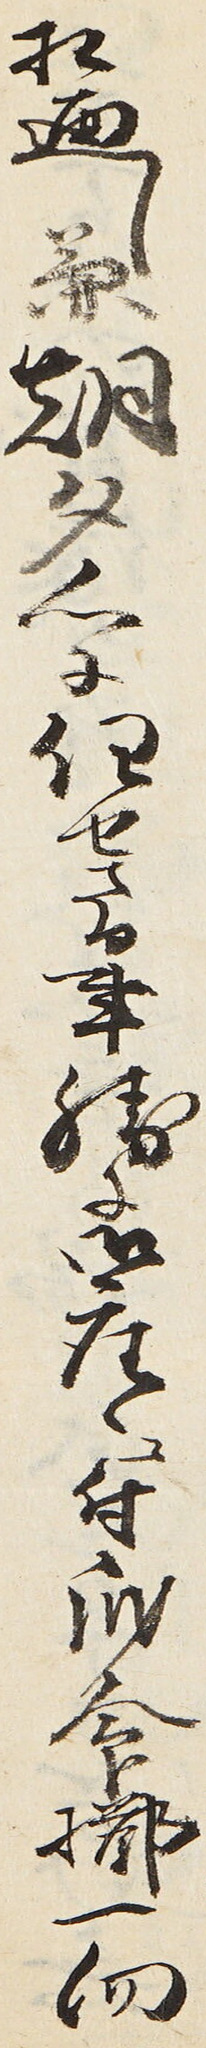相通し兼朝夕心に住せさる事勝に御座候に付身命擲一向
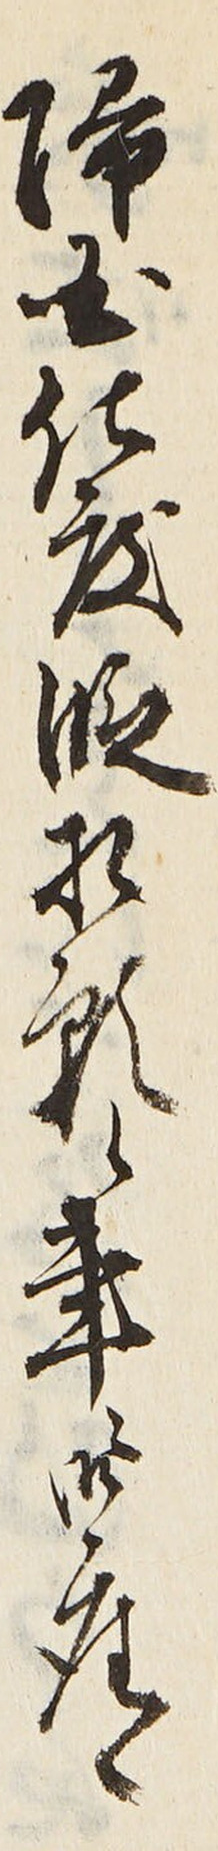帰国仕度段相願候事に御座候
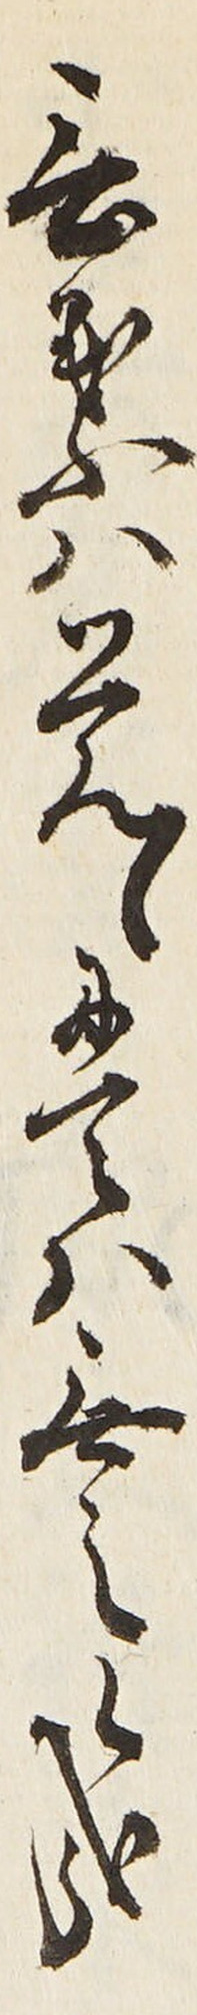言葉は覚候にては無之候哉
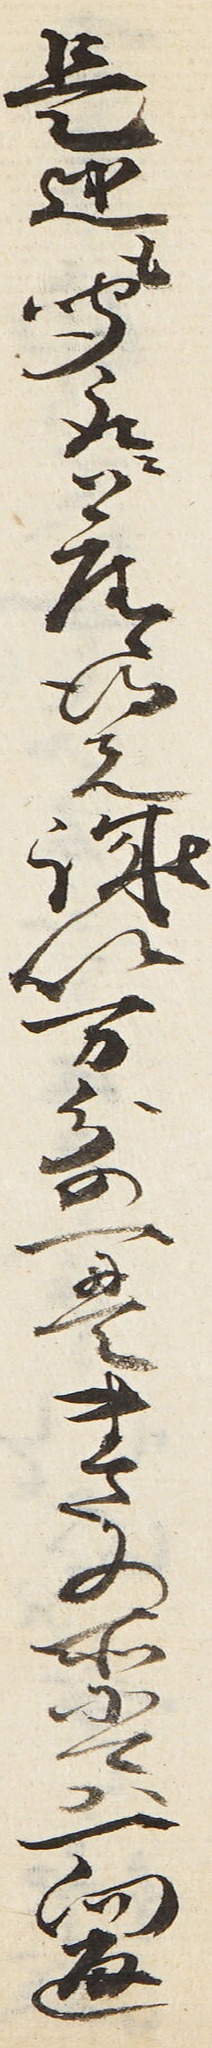是迚も聞取に御座候得は誠以万分の一にてまさかの所にては一向通
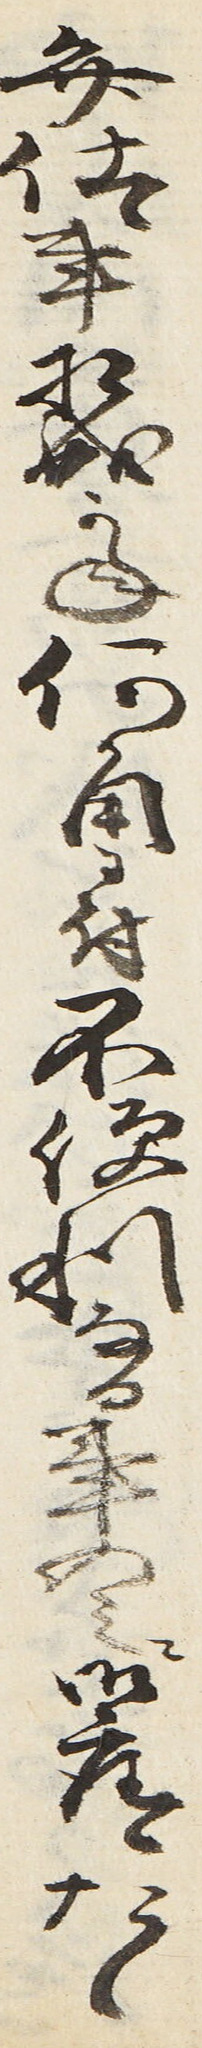弁仕候事相成かね何角に付不便利なる事のみに御座候たゝ
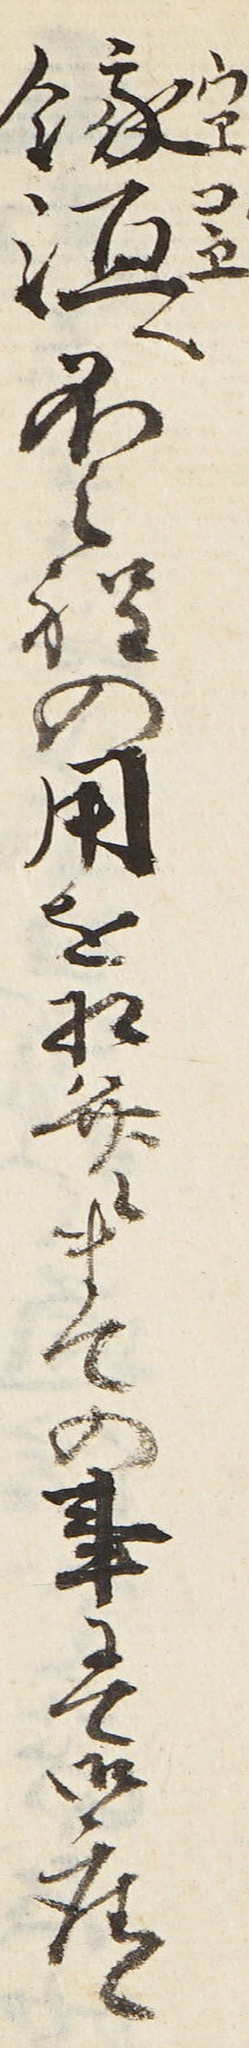餓冱へ不申程の用を相弁候まての事にて御座候
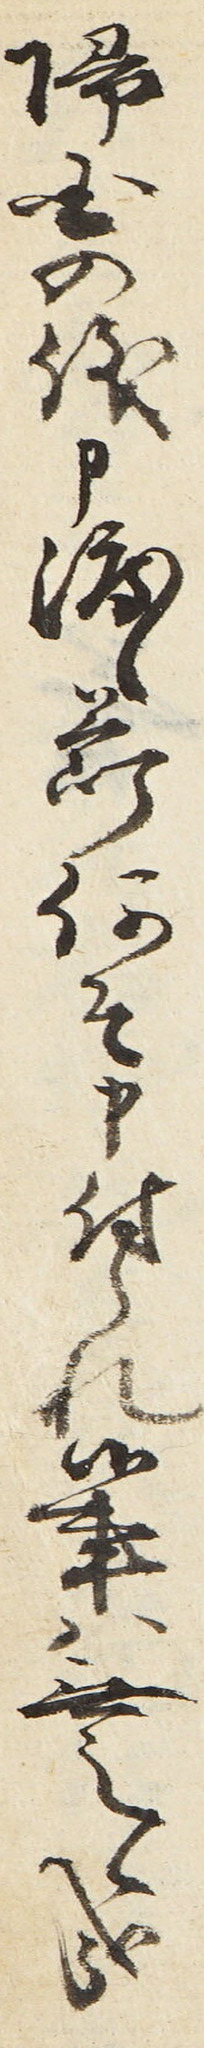帰国の儀申渡し候節何そ申付られ候事は無之候哉

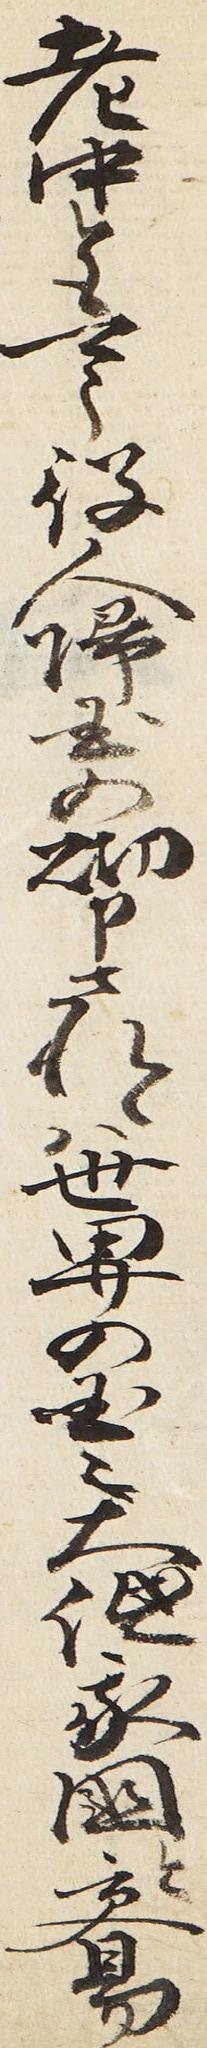老中とも可申役人帰国の砌申され候は世界の国々大低我国と交易
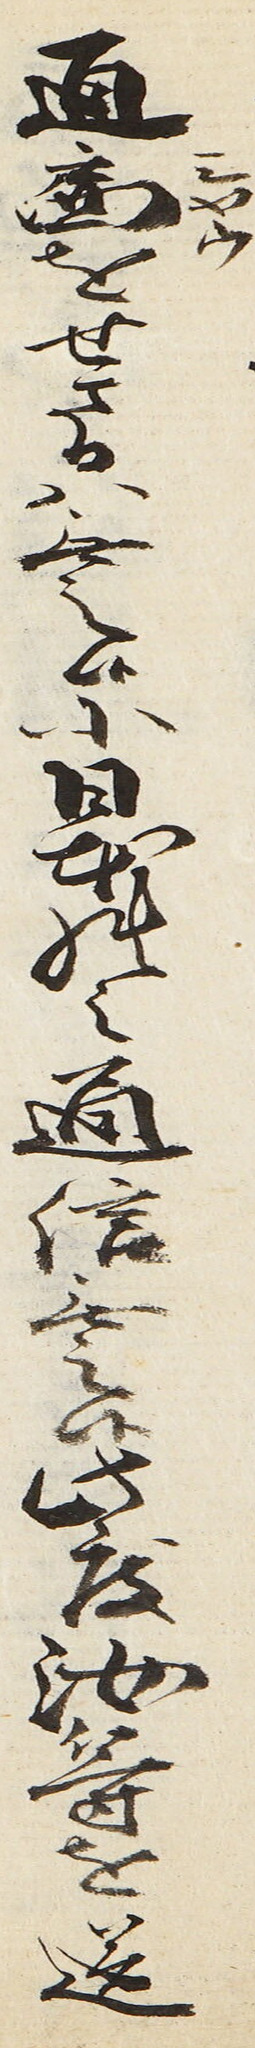通商をせさるは無之候に日本のみ通信無之候此度汝等を送
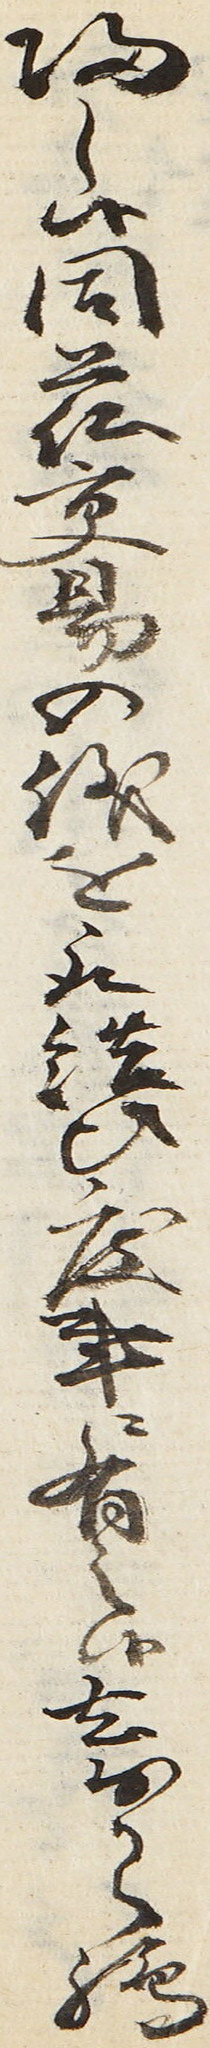帰し候同茲交易の儀を取結ひ度事に有之候去なから強
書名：漂民御覧之記
